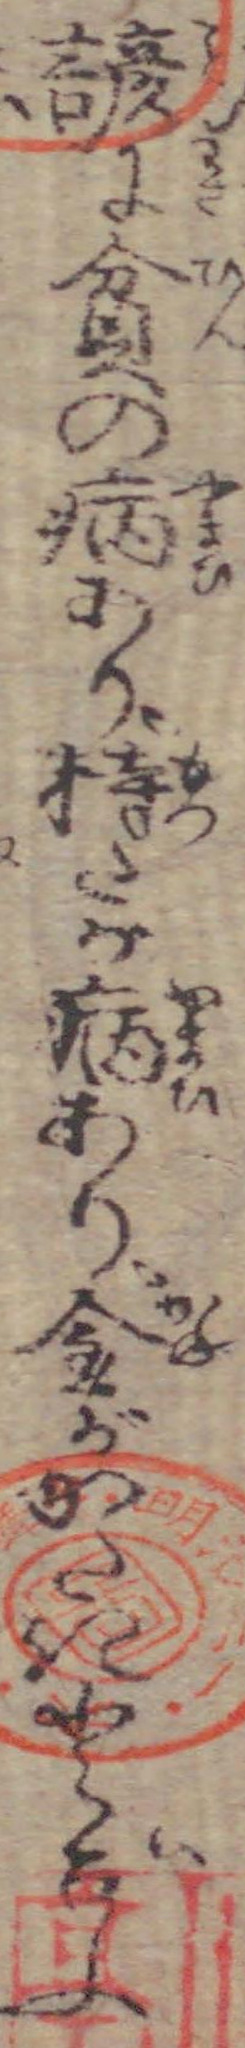諺に貧の病あり。持たが病あり。金がかたきと云ふ
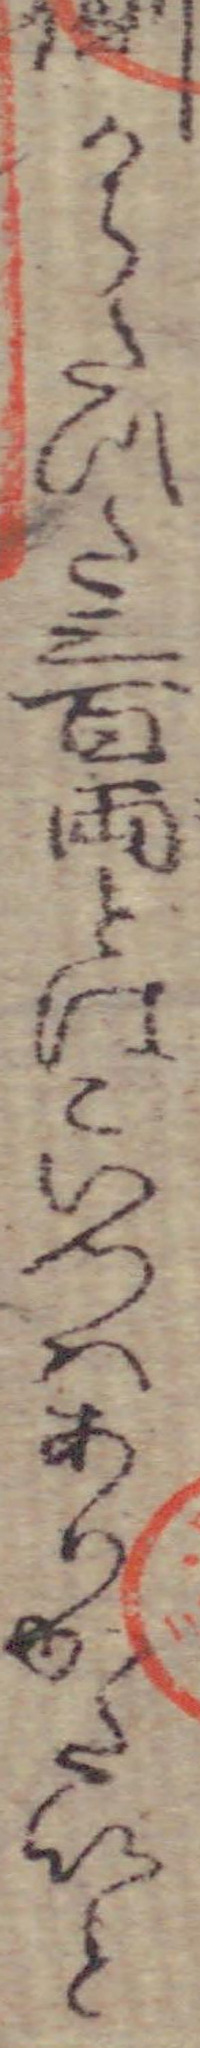側からたつた三百両とはこいつはありかたいと
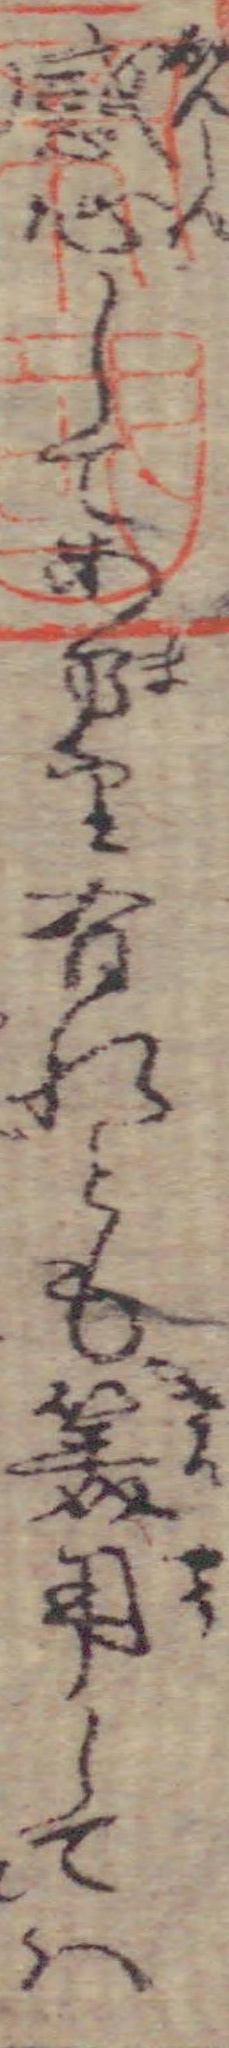感心してあまり有れとも。算用しては
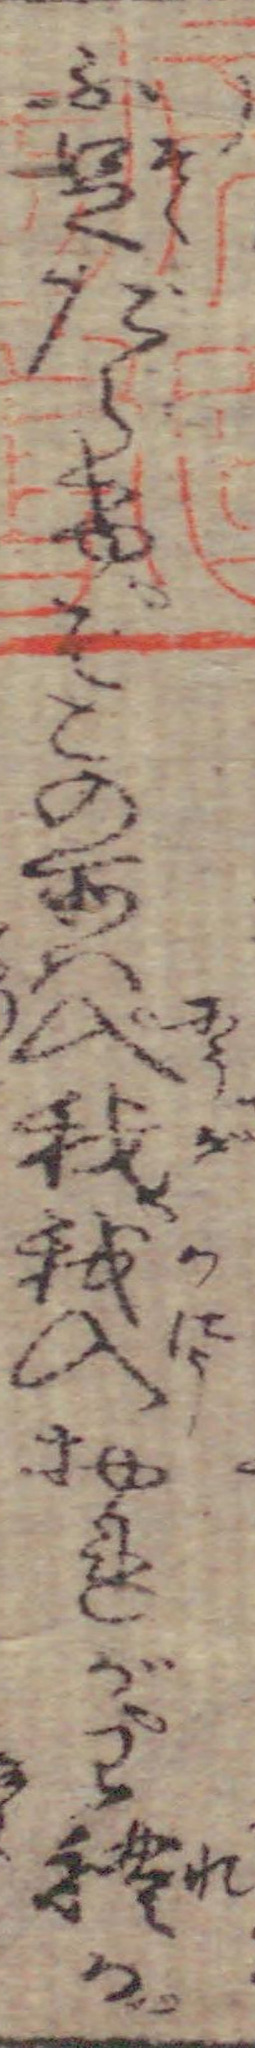ふ足だらけ。そこの所は入我我入のおれが。われる。
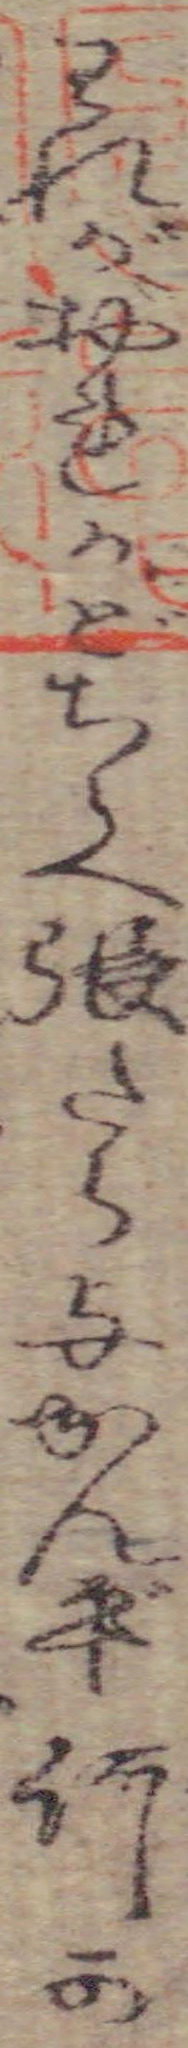われがおれかどちらへ張たら与かん゛平何か
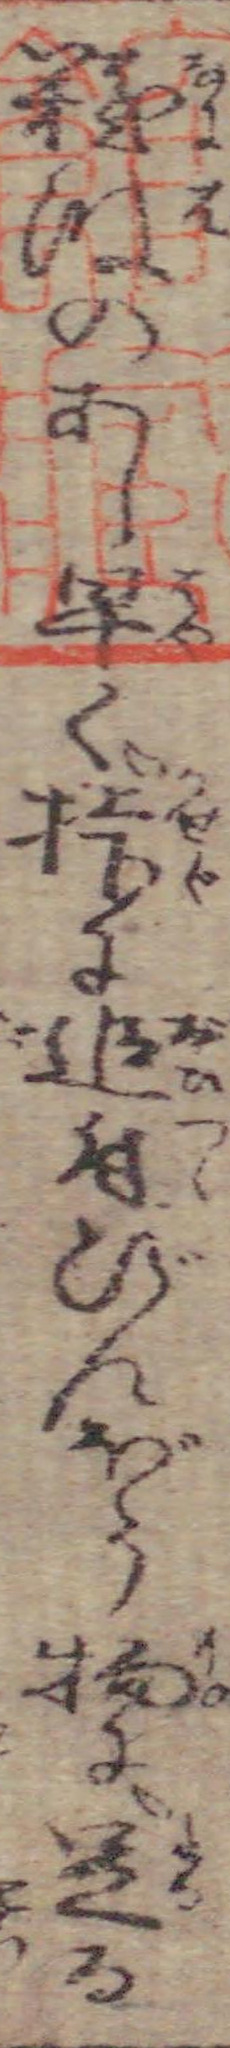難波のあし早く。桛に追付びんぼう物に。足る
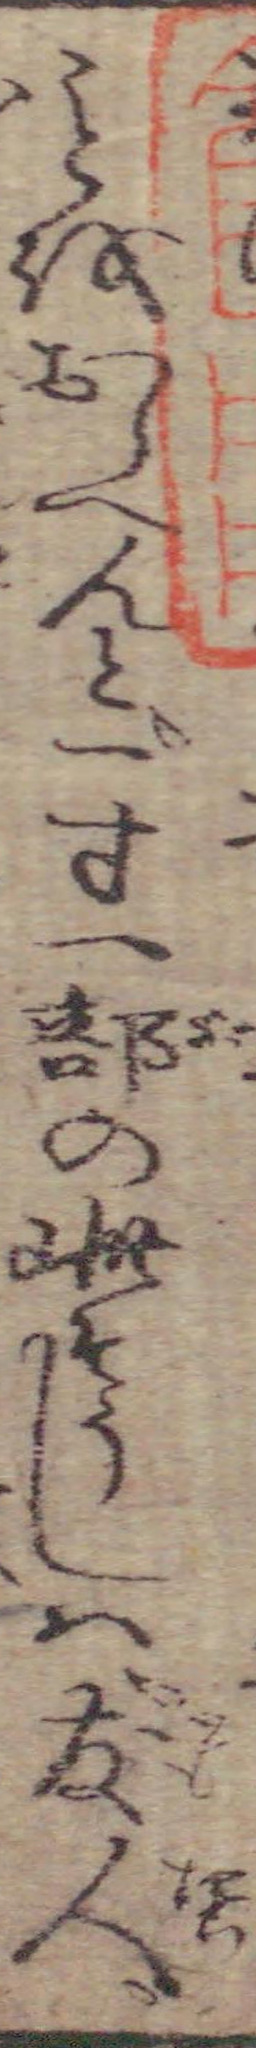ことをおしへんと。一寸一部の此そうしは。友人。
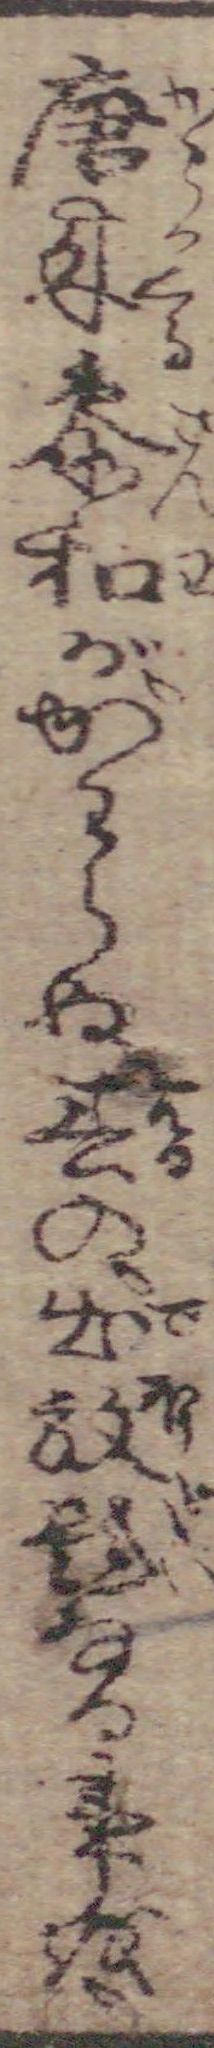唐莱参和が。かわらぬ春の出放題なる事を。

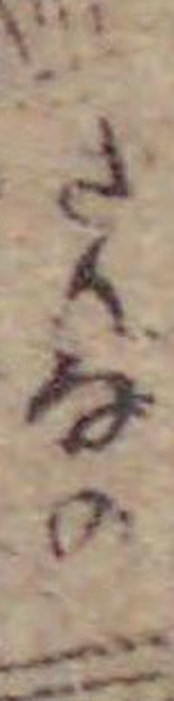たんなの
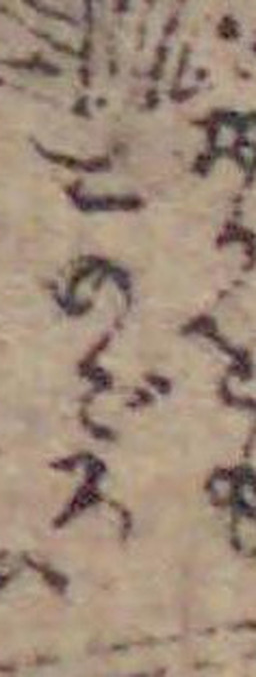このごろは
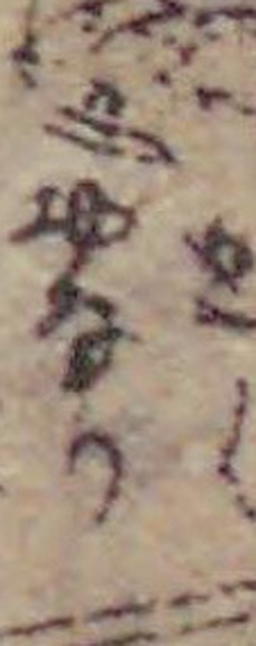おなり
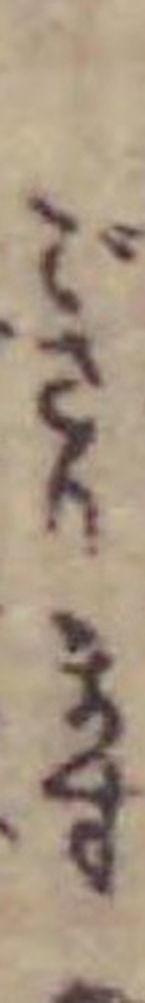ごさります
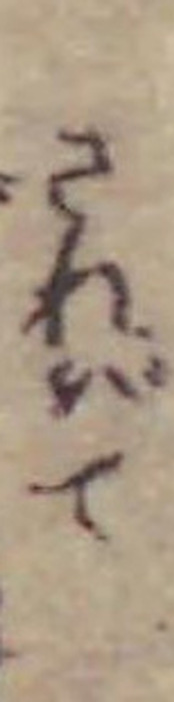さればて
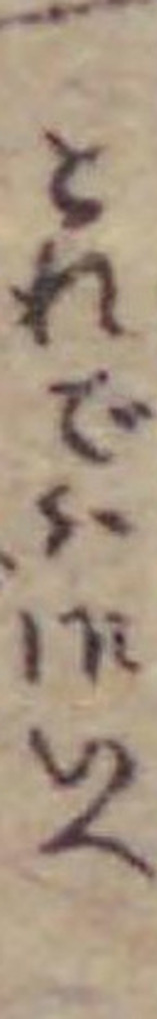これでは御いへ
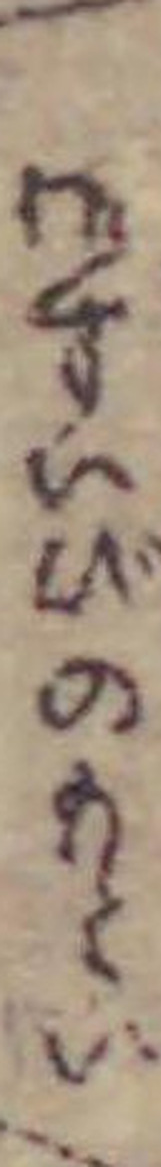御すいびのもとい
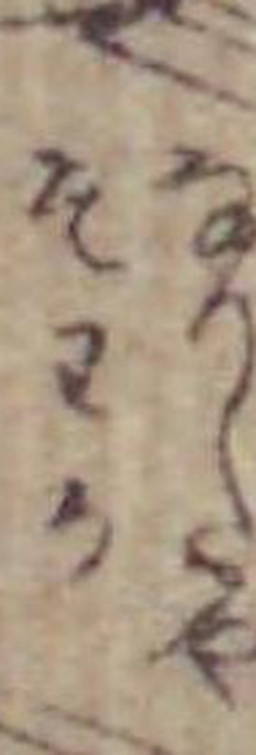そわか
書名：莫切自根金生木 : 3巻
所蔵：国立国会図書館 National Diet Library, JAPAN
